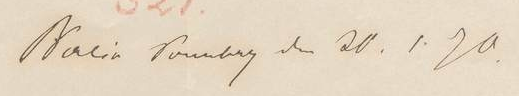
Berlin Sonntag den 20. 1. 70.
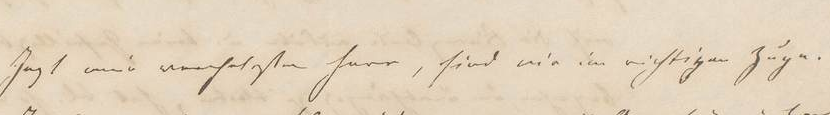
Jetzt mein verehrtester Herr, sind wir im richtigen Zuge.
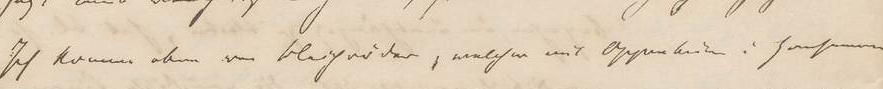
Ich komme eben von Bleichröder, welcher mit Oppenheim u Hansemann
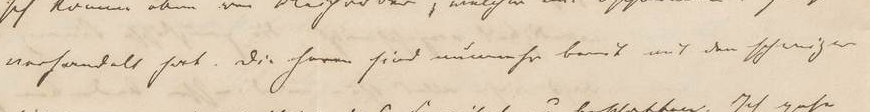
verhandelt hat. Die Herrn sind nunmehr bereit mit den schweizer
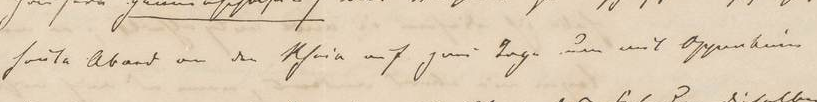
heute Abend an den Rhein auf zwei Tage um mit Oppenheim u
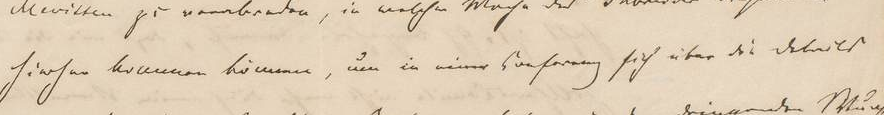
hierher kommen können, um in einer Conferenz sich über die Details
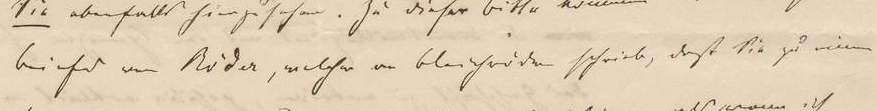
Briefes von Röder, welcher an Bleichröder schrieb, daß Sie zu einer
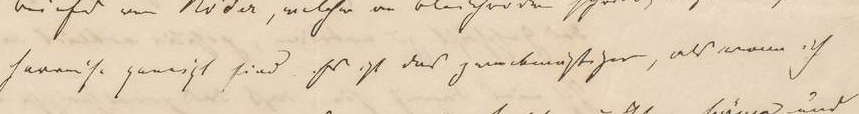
Herreise geneigt sind. Es ist das zweckmäßiger, als wenn ich
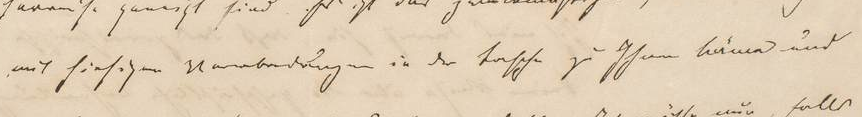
mit hiesigen Verabredungen in der Tasche zu Ihnen käme und
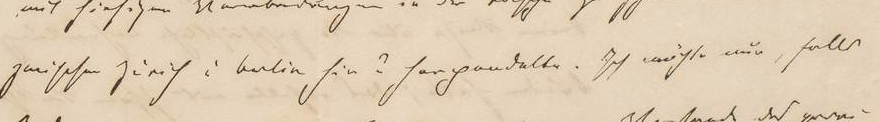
zwischen Zürich u Berlin hin u herpendelte. Ich möchte nur, falls
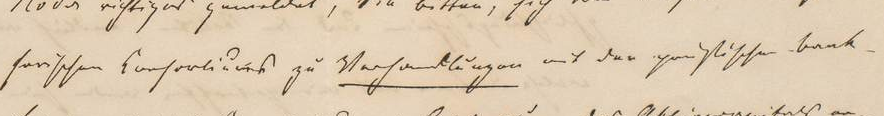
sorischen Consortiums zu Verhandlungen mit den preußischen Bank-
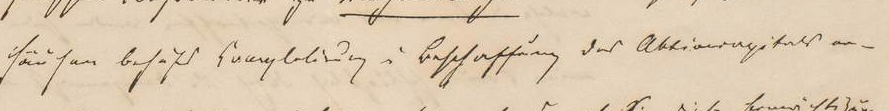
häusern behufs Completirung u Beschaffung des Aktiencapitals er-
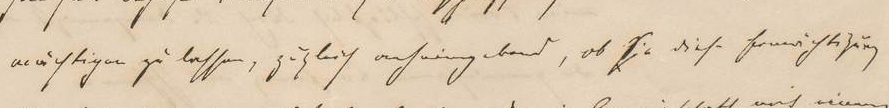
mächtigen zu lassen, zugleich anheimgebend, ob Sie diese Ermächtigung
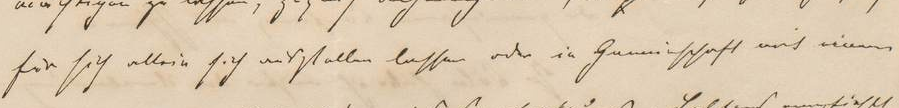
für sich allein sich ausstellen lassen oder in Gemeinschaft mit einem
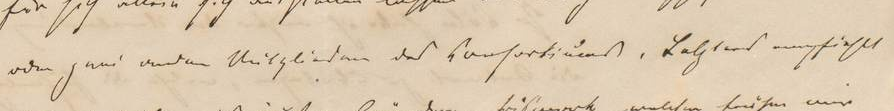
oder zwei andern Mitgliedern des Consortiums, Legrand empfiehlt
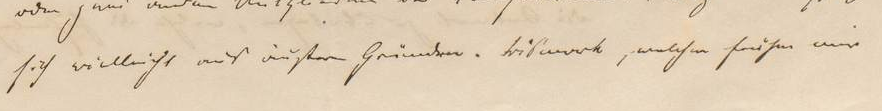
sich vielleicht aus äußern Gründen. Bismark, welcher früher mir
